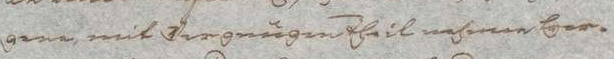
gene, mit Vergnügen Theil nehmen wer-
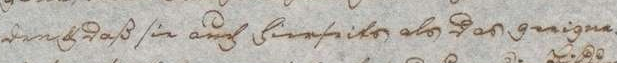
den & daß sie auch hierseits als das geeigne-
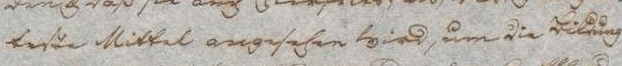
teste Mittel angesehen wird, um die Bildung
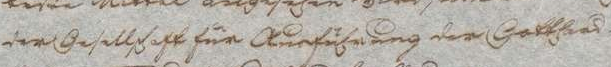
der Gesellschaft für Ausführung der Gotthard -
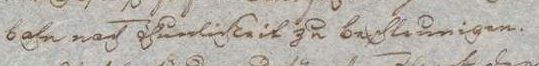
bahn nach Thunlichkeit zu beschleunigen.
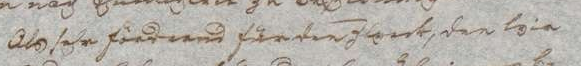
Als sehr fördernd für den Zweck, den wir
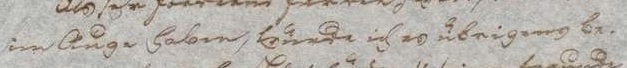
im Auge haben, würde ich es übrigens be-
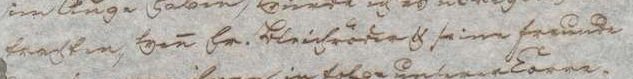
trachten, wenn Hr. Bleichröder & seine Freunde
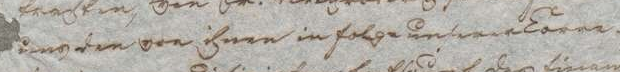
uns den von ihnen in Folge unserer Corre-
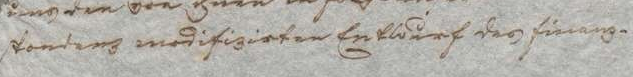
spondenz modifizirten Entwurf des Finanz-
